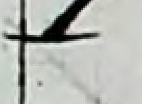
I
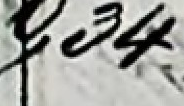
0,34
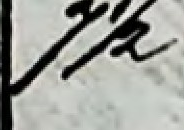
7 1/2
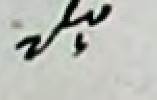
Do
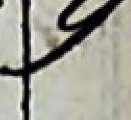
9
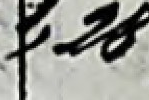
1,28
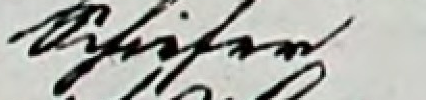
Schiefer
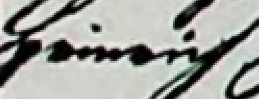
Heinrich
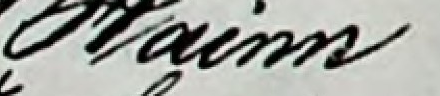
Hainn
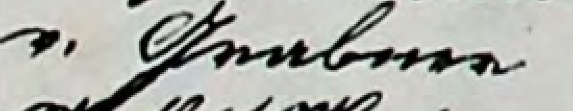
v. Grabner
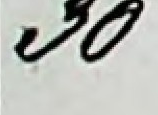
30
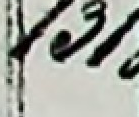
131
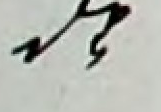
Do
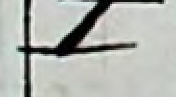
I
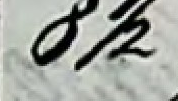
8 1/2
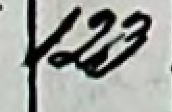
123
